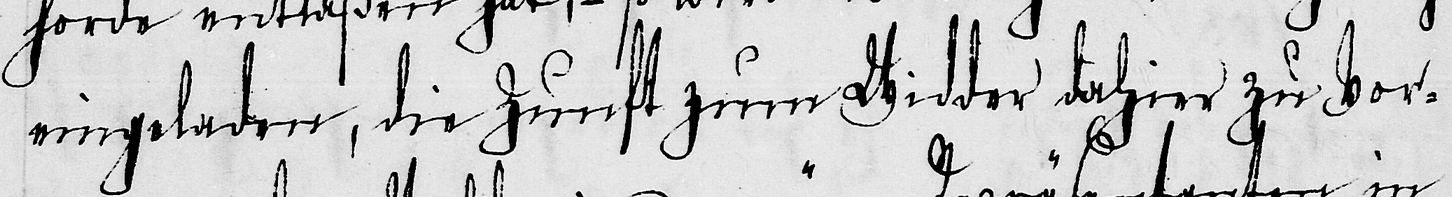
eingeladen, die Zunft zum Widder dahier zu Vor¬
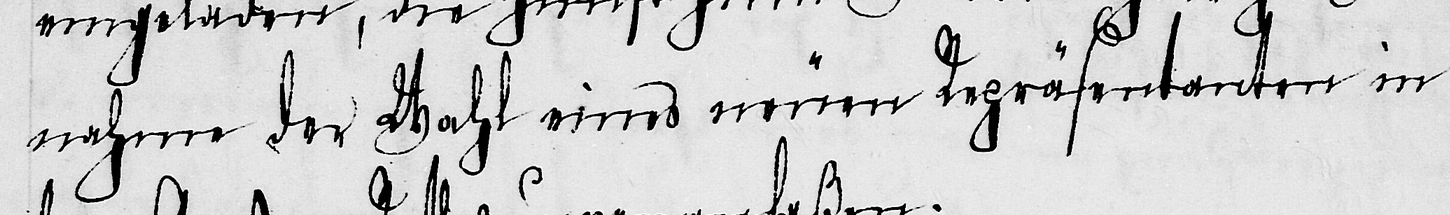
nahme der Wahl eines neuen Repräsentanten in
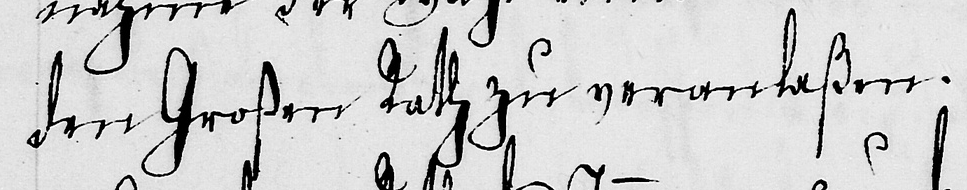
den Großen Rath zu veranlaßen.
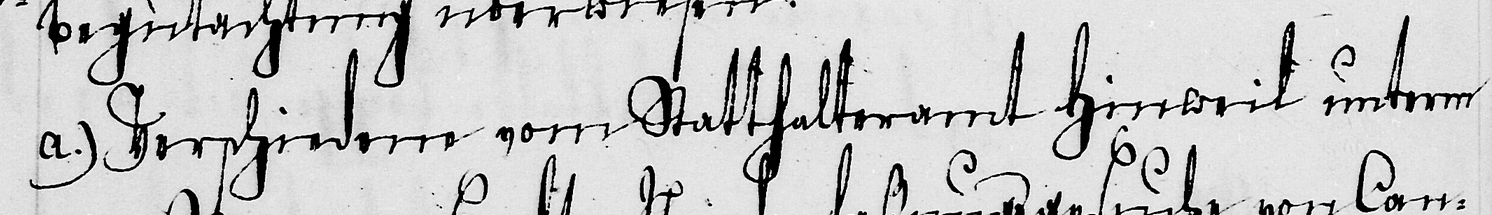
a.) Verschiedene vom Statthalteramt Hinweil unterm
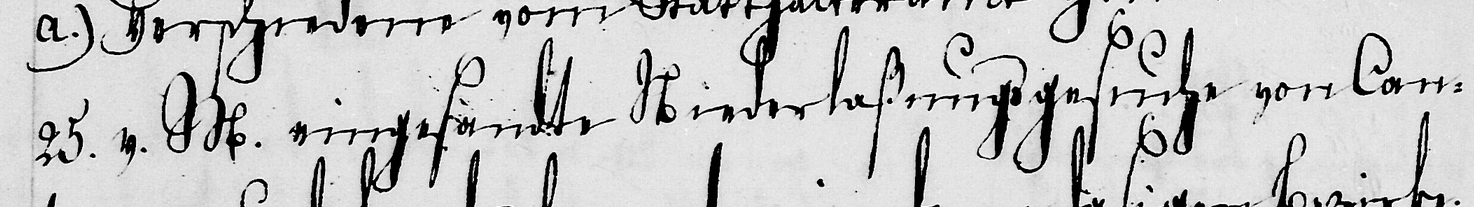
25. v. M. eingesandte Niederlaßungsgesuche von Can¬
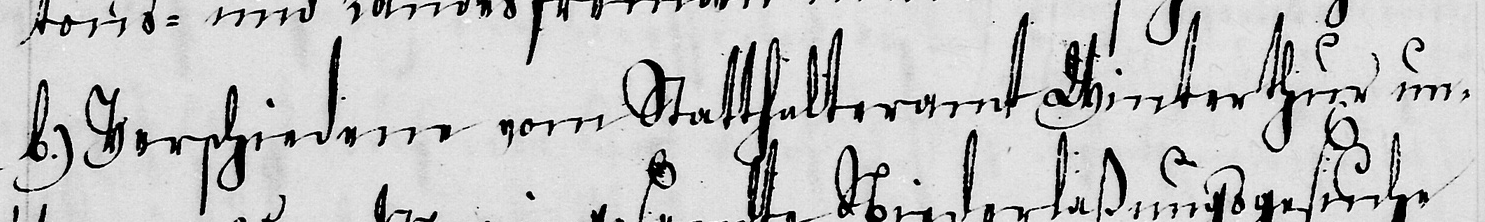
b.) Verschiedene vom Statthalteramt Winterthur un¬
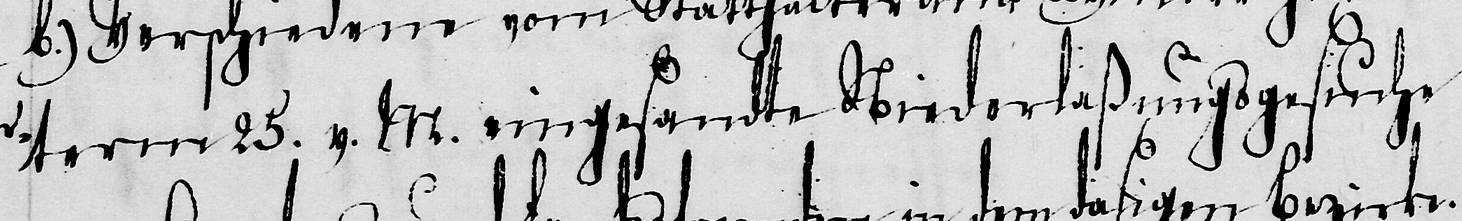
term 25. v. M. eingesandte Niederlaßungsgesuche
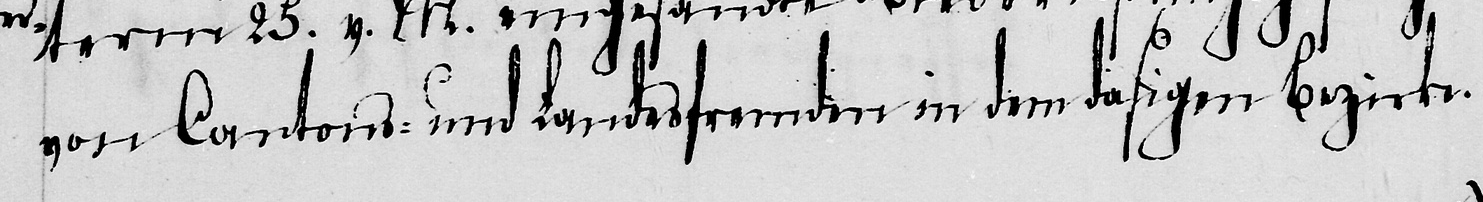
von Cantons- und Landesfremden in dem dasigen Bezirke.
